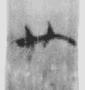廿
